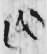州
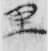里
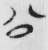公
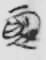婁
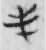毛
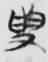受
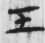壬
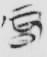晨
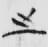之
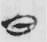日
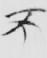不
